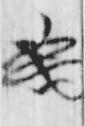弟
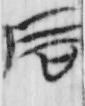石
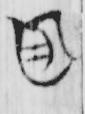耴
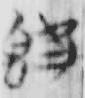既
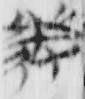發
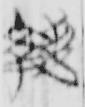執
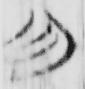勿
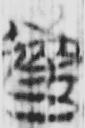○（失）
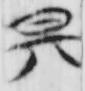{日亓}（期）
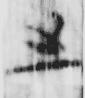之
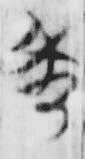秀
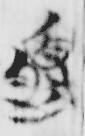○（履）
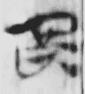爲
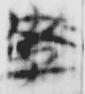李
